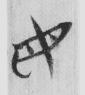母
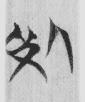死
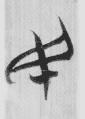民
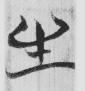生
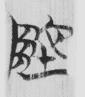地
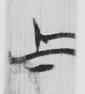上
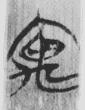寓
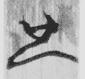也
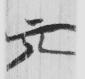亓
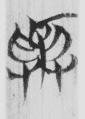與
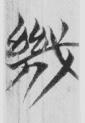幾
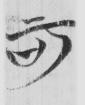可
